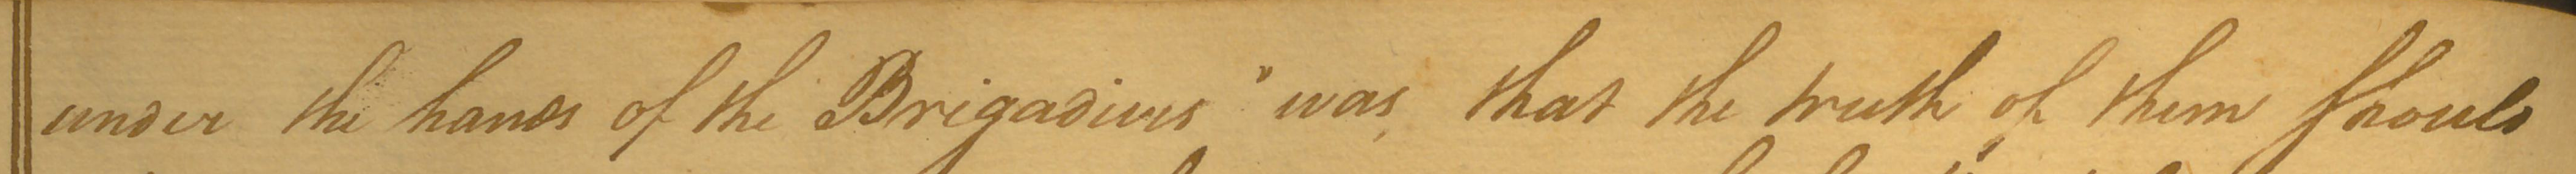under the hands of the Brigadiers was that the truth of them should
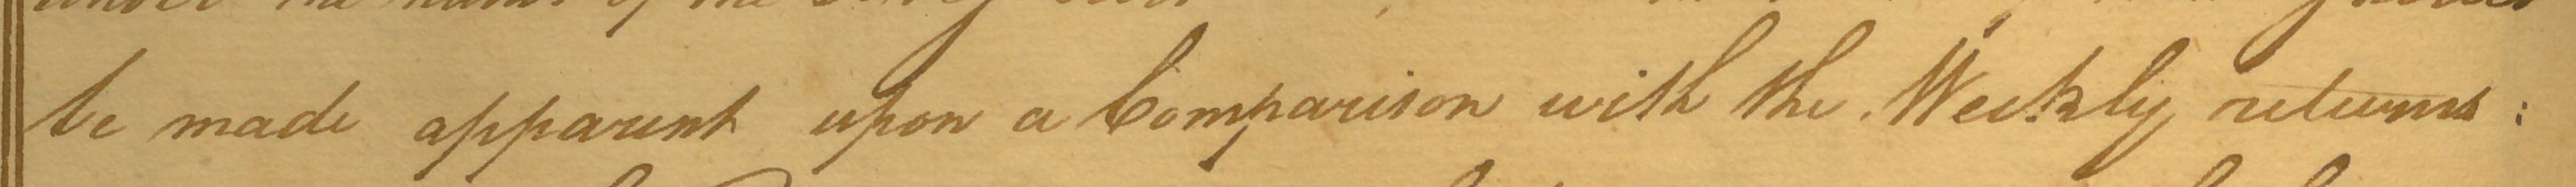be made apparent upon a Comparison with the Weekly returns:
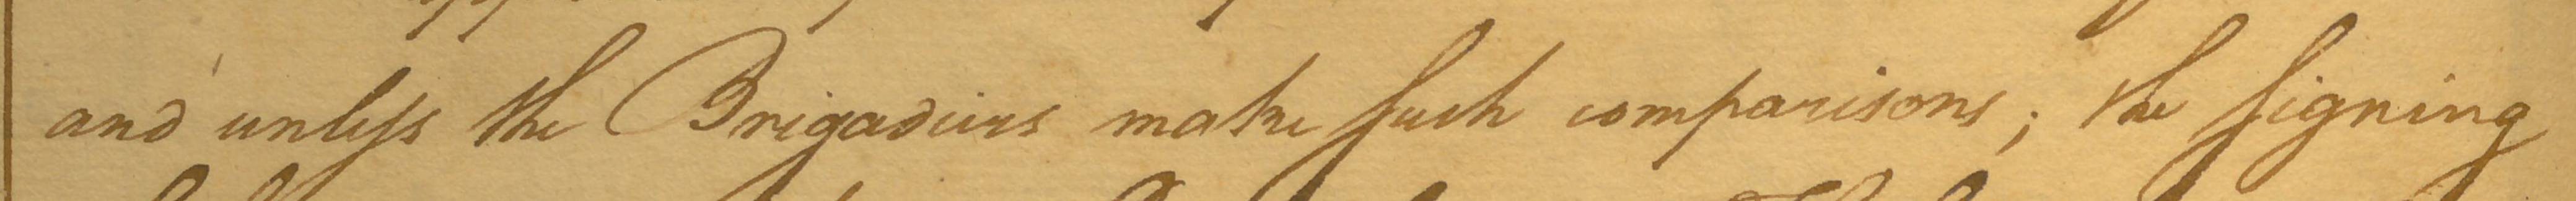and unless the Brigadiers make such comparisons; the Signing
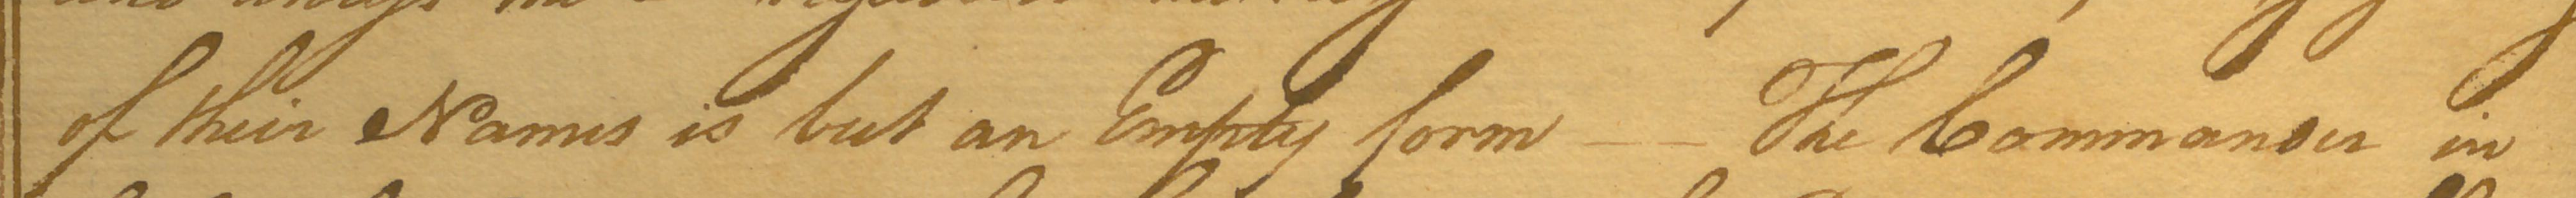of their Names is but an Empty form- The Commander in
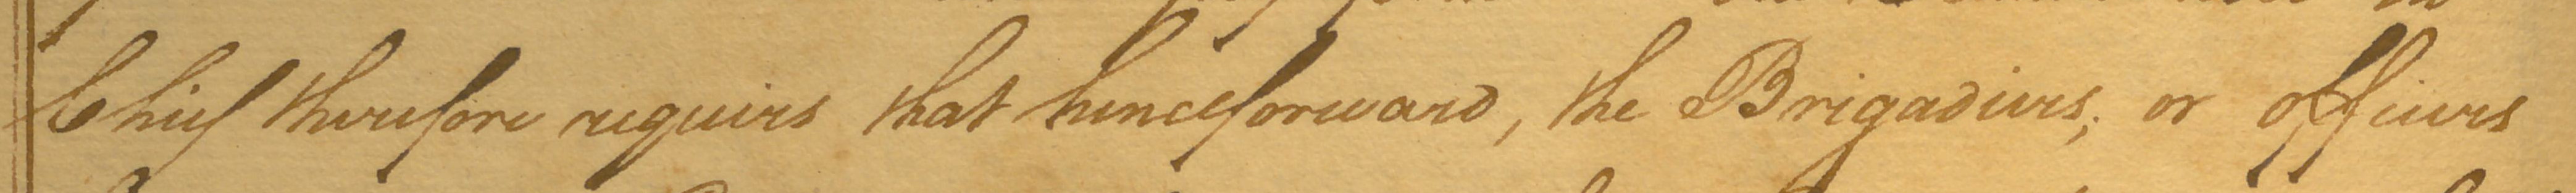Chief therefore requirs that henceforward the Brigadiers; or officers
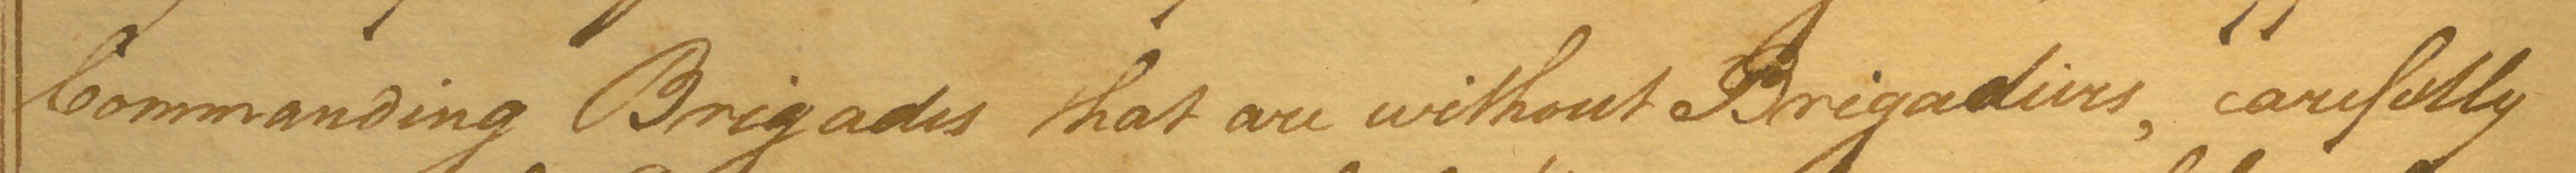Commanding Brigades that are without Brigadiers, carefully
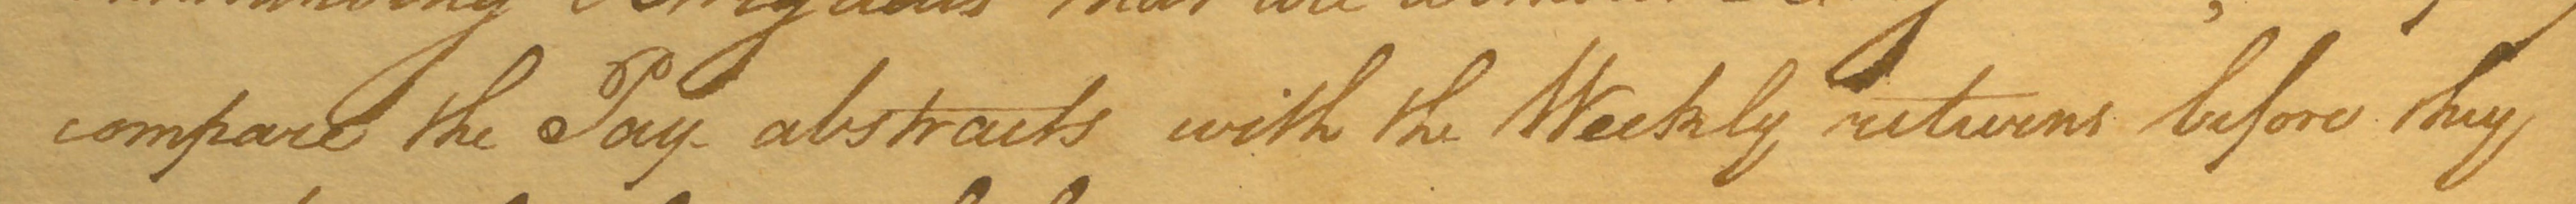compare the Pay abstracts with the Weekly returns before they
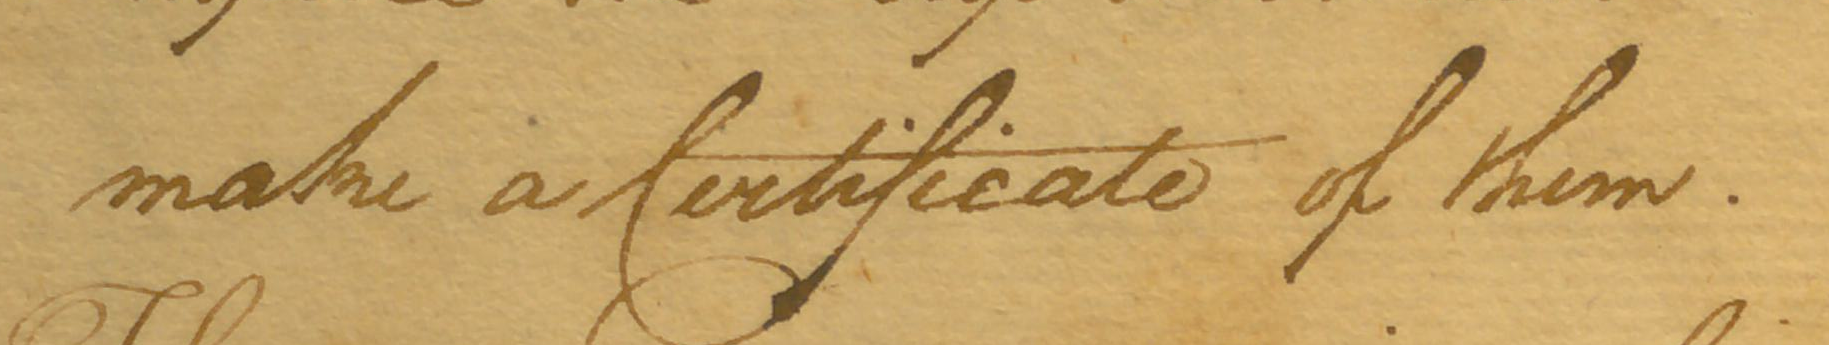make a Certificate of them.
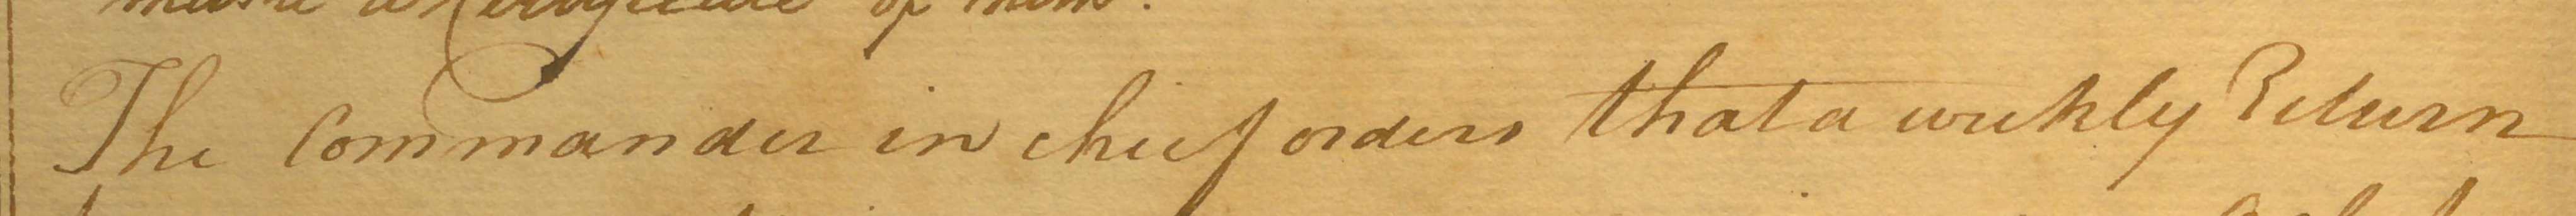The commander in chief orders that a weekly Return
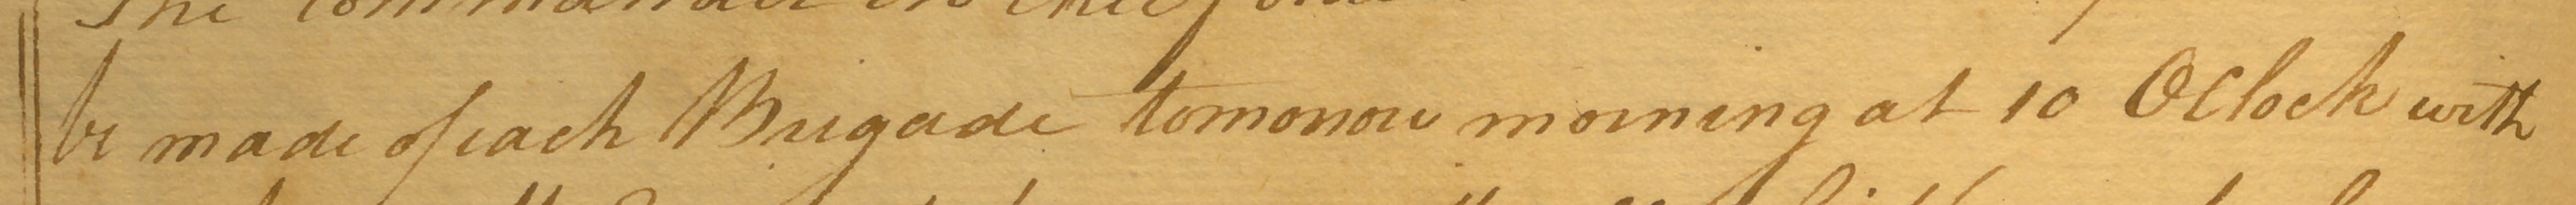be made of each Brigade tomorrow morning at 10 OClock with
